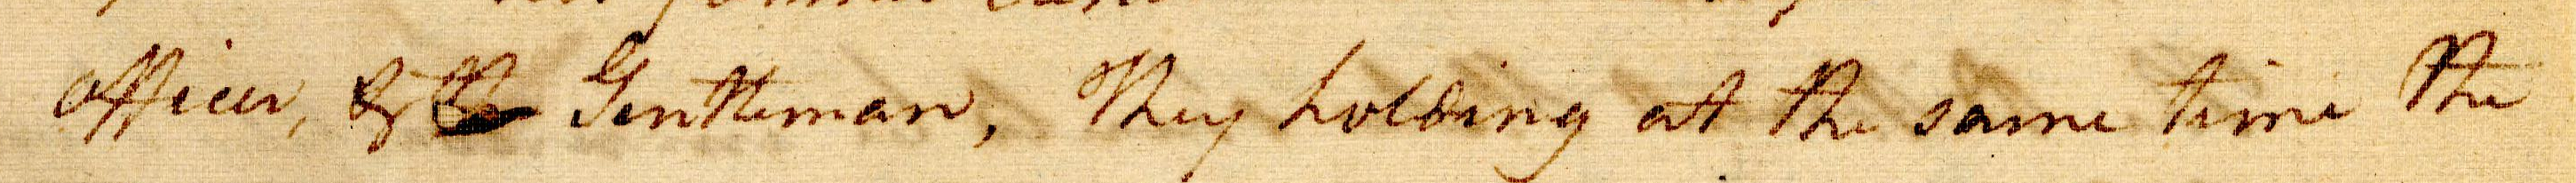officer, & Gentleman, They holding at the same time the
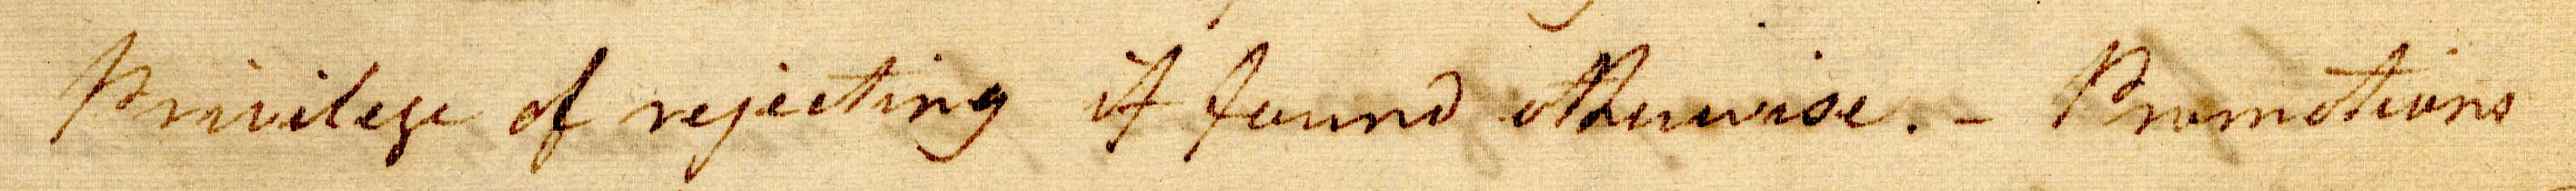Privilege of rejecting if found otherwise.- Promotions
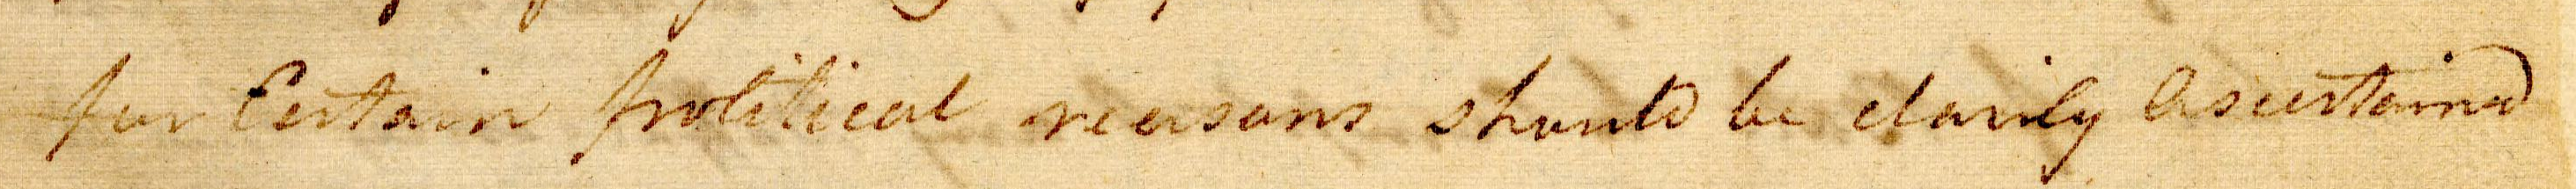for Certain political reasons should be clarily Ascertained
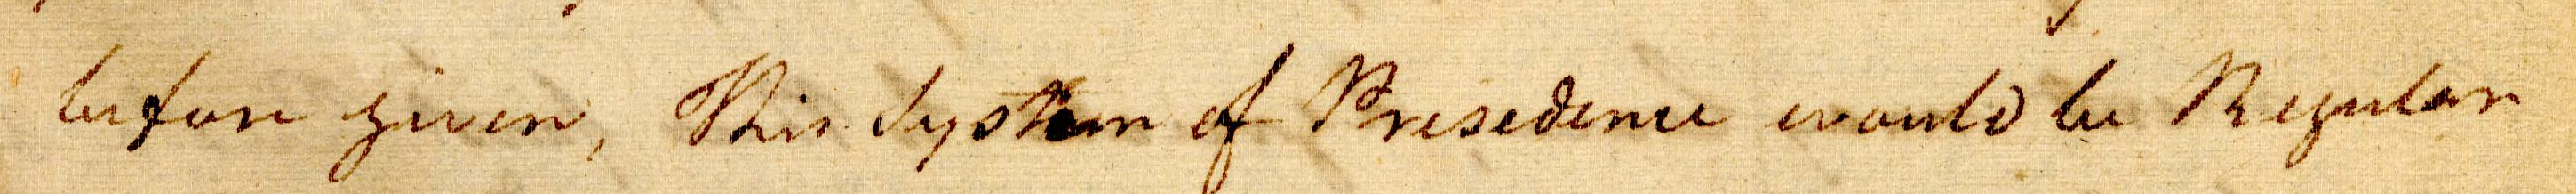before given, This system of Presidence would be Regular
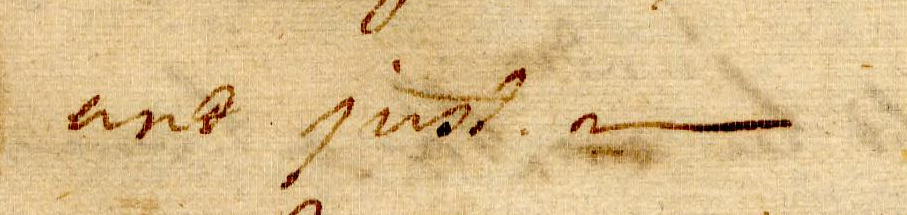and just.-
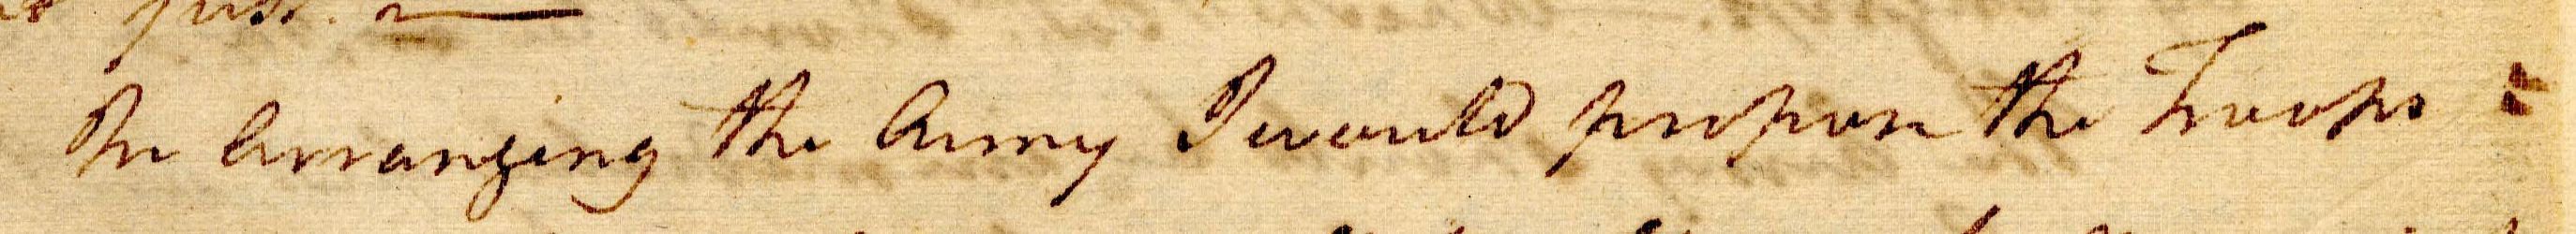In Arranging the Army I would propose the Troops
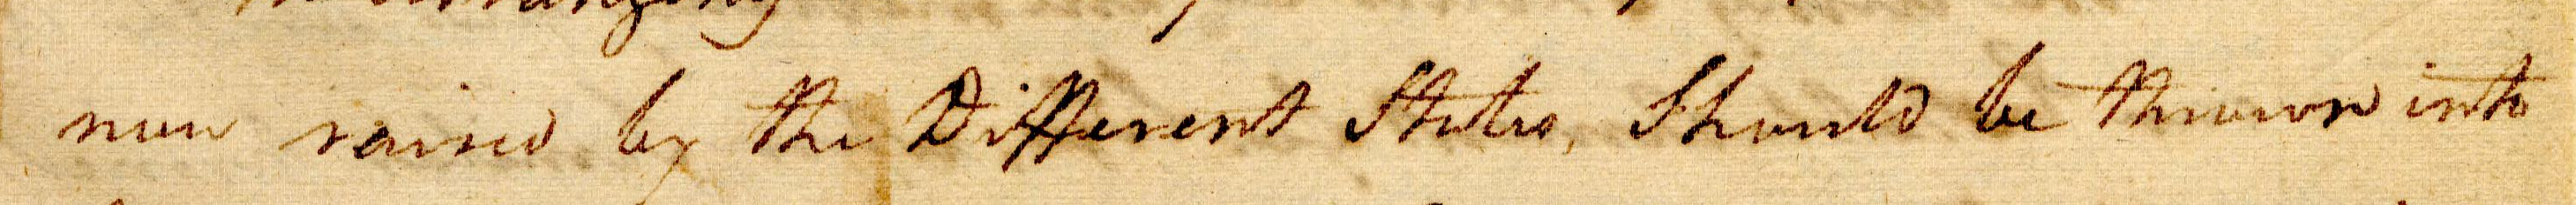now raised by the Different States Should be thrown into
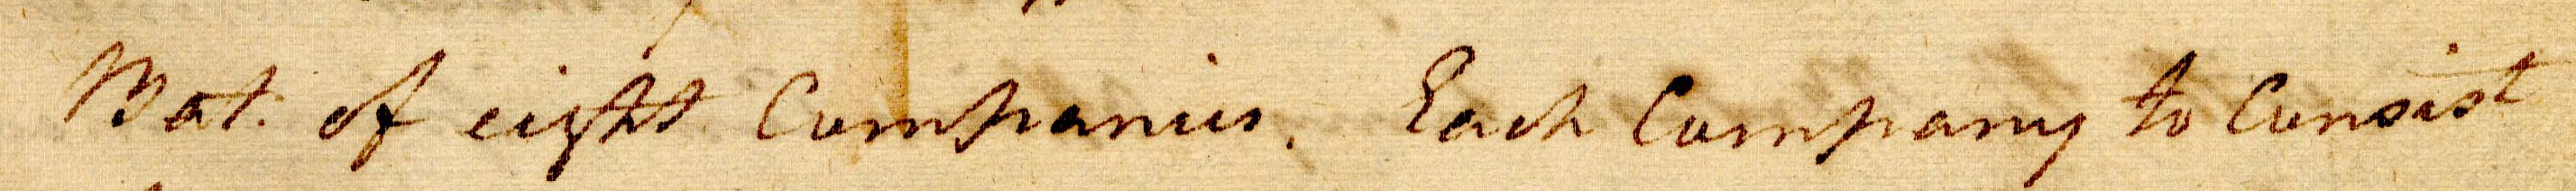Bat: of eight Companies. Each Company to consist
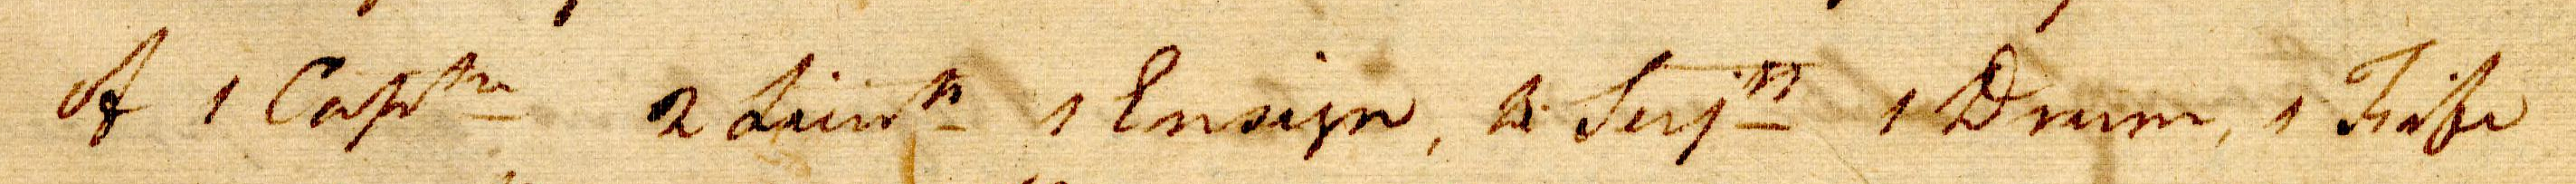of 1 Cap^tn 2 Lieu^ts 1 Ensign, 4 Serj^ts 1 Drum, 1 Fife
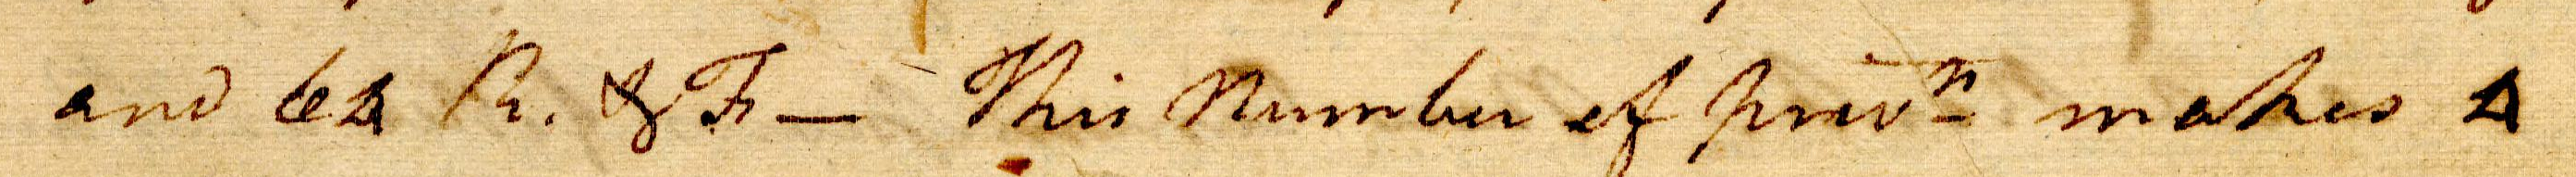and 64 R. & F- This number of priv^ts makes 4
